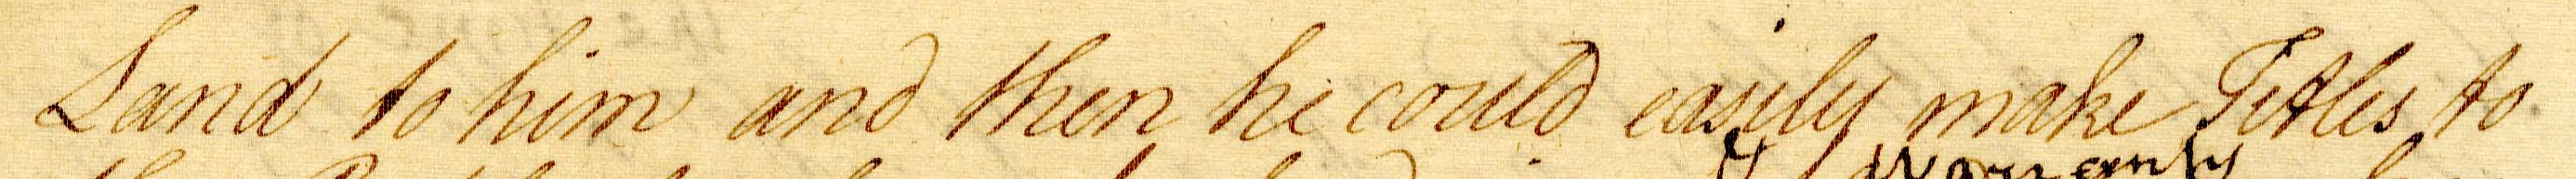Land to him and then he could easily make Titles to
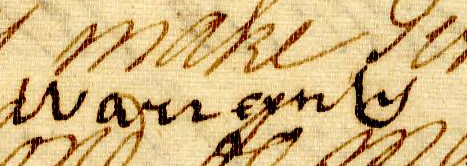warranty
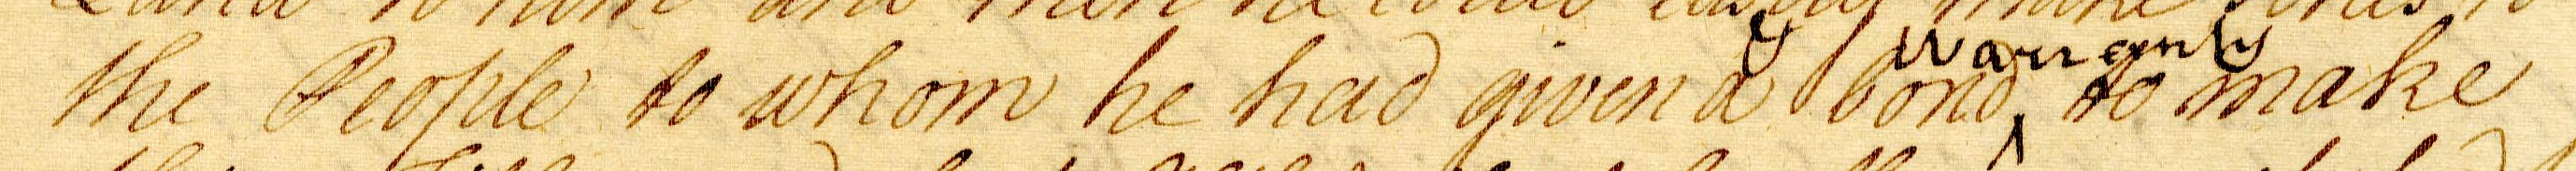the People to whom he had given a bond ^ to make
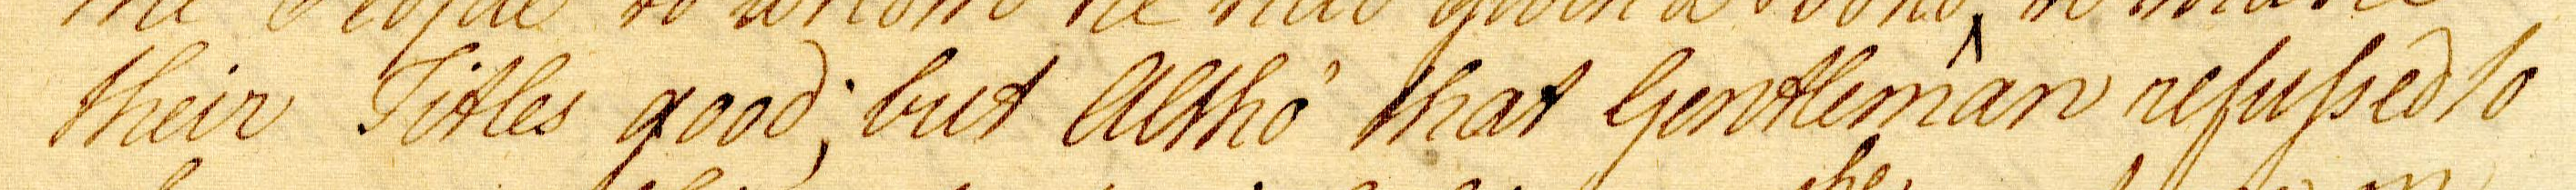their Titles good; but Altho' that Gentleman refussed to
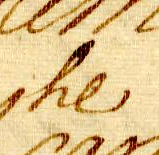he
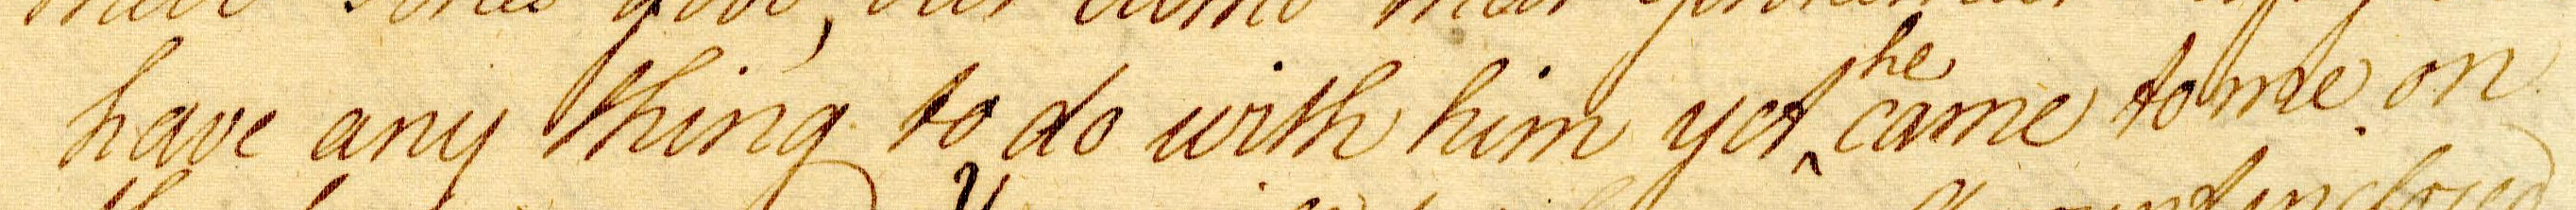have any thing to do with him yet ^ came to me on
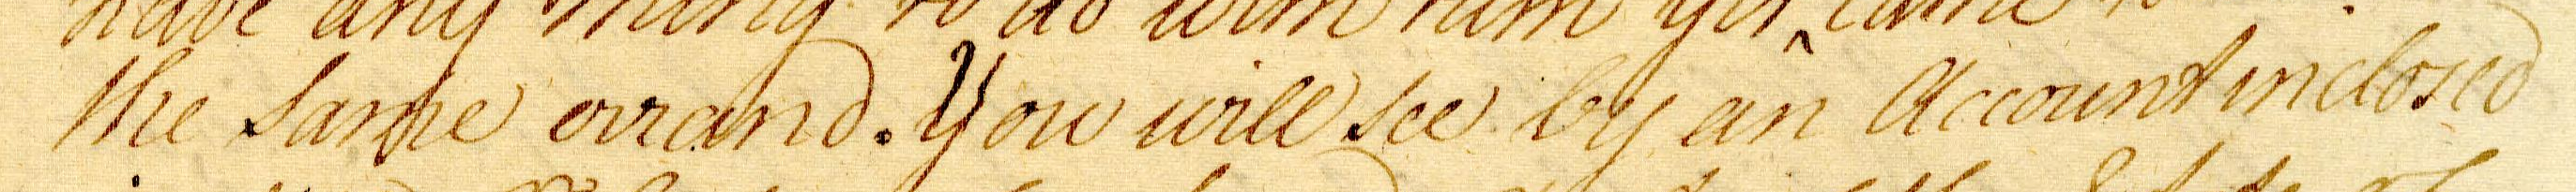the Same errand. You will see by an Account inclosed
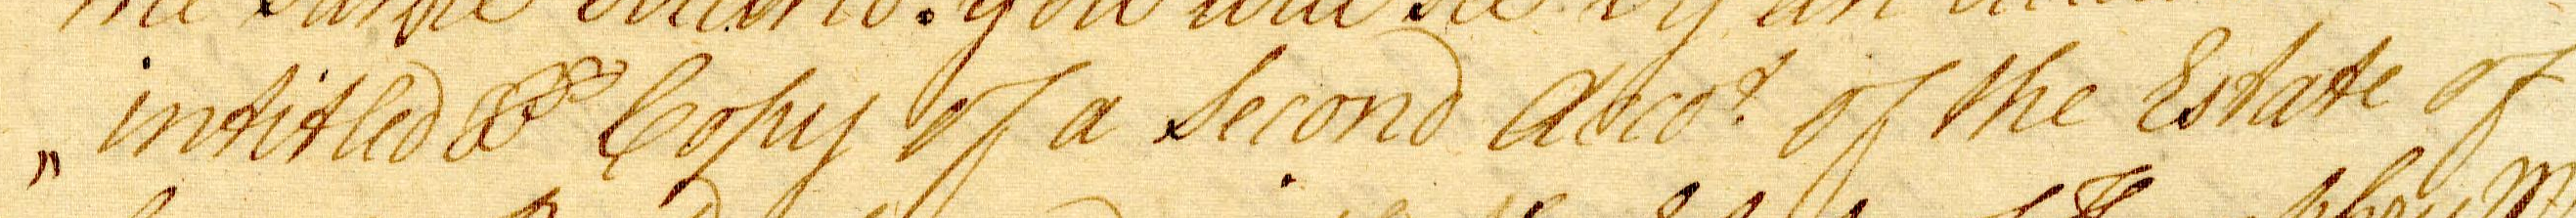"intitled per Copy of a Second Acco^t. of the Estate of
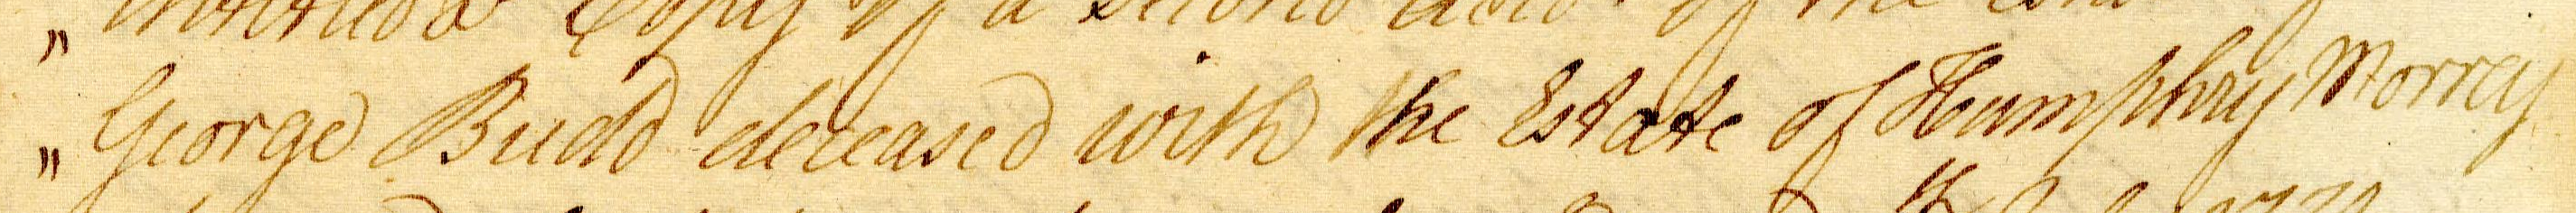"George Budd deceased with the Estate of Humphrey Morris
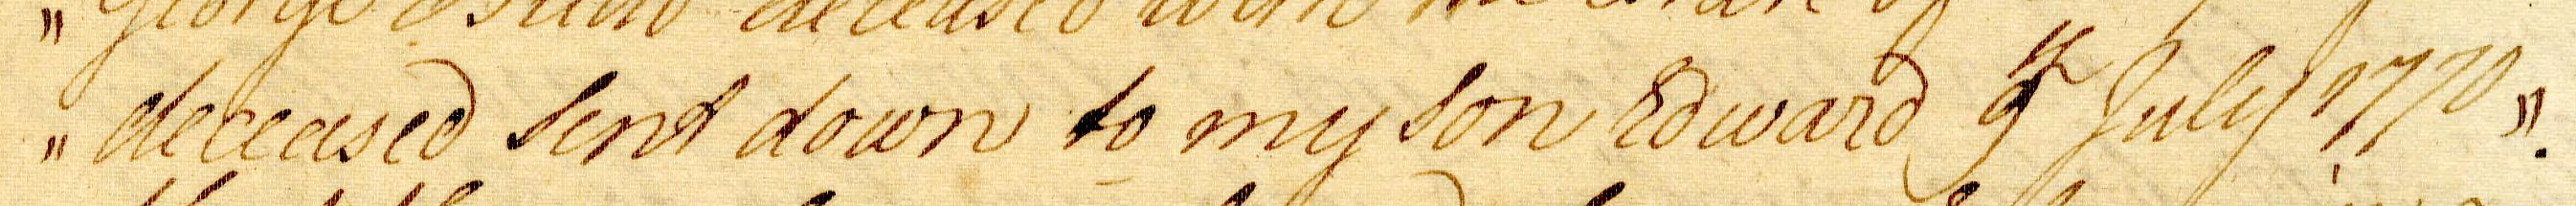"deceased Sent down to my Son Edward 9^th July 1770"
